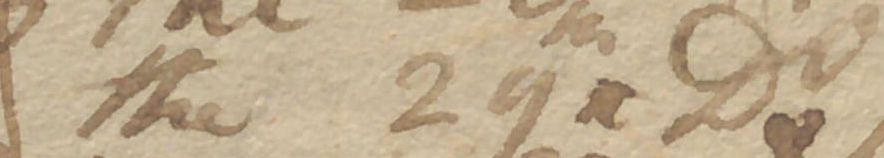the 29^th D^o.
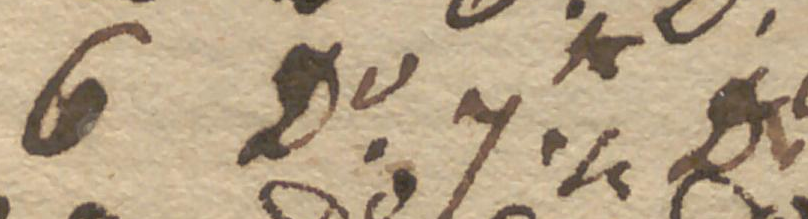6 D^o. 7^th. D^o.
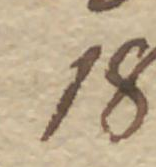18
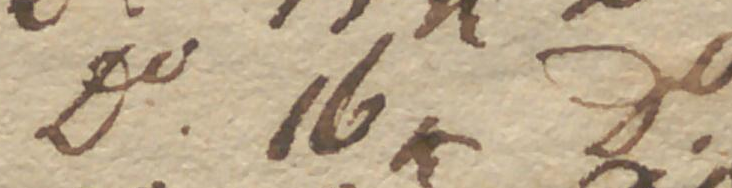D^o. 16^th D^o.
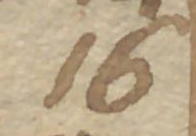16
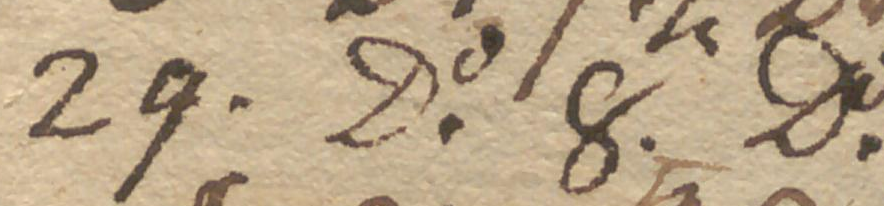29. D^o. 8^th. D^o.
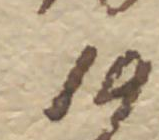19
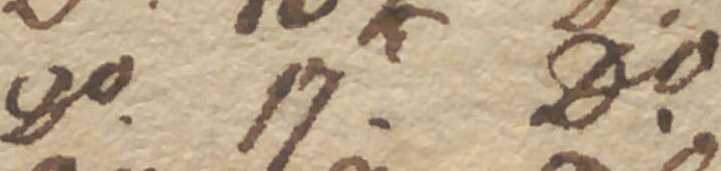D^o. 17^th. D^o.
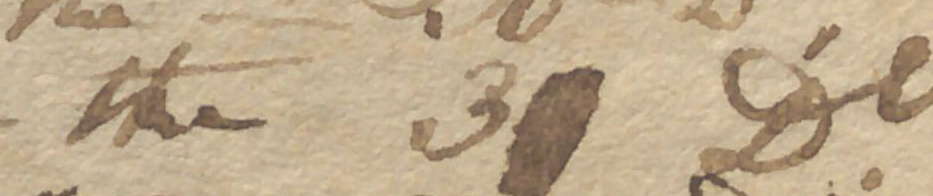the 31 D^o.
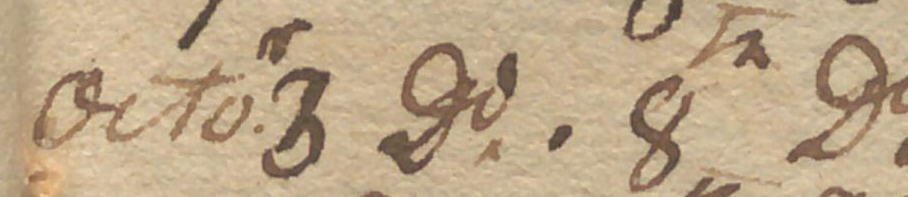Octo^r. 3 D^o. 8^th D^o.
